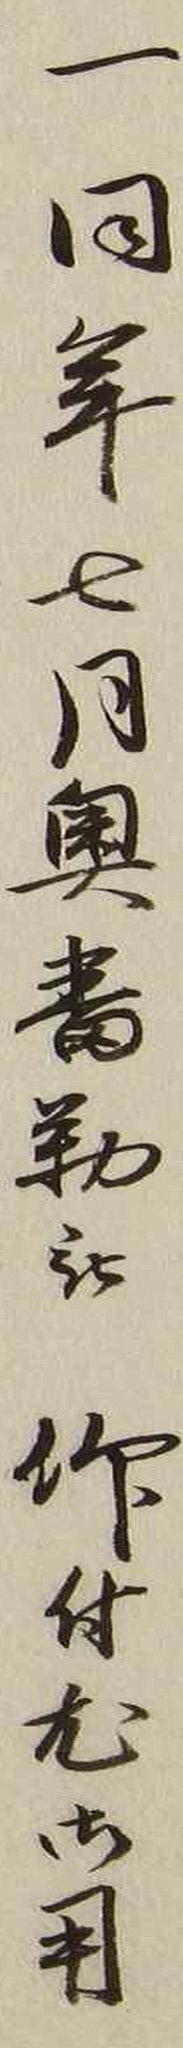一同年七月奥番勤被仰付尤御用
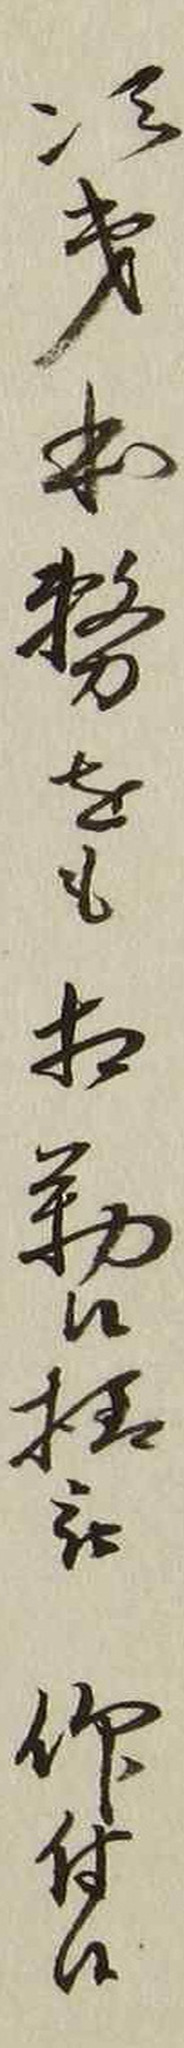次第本務をも相勤候様被仰付候
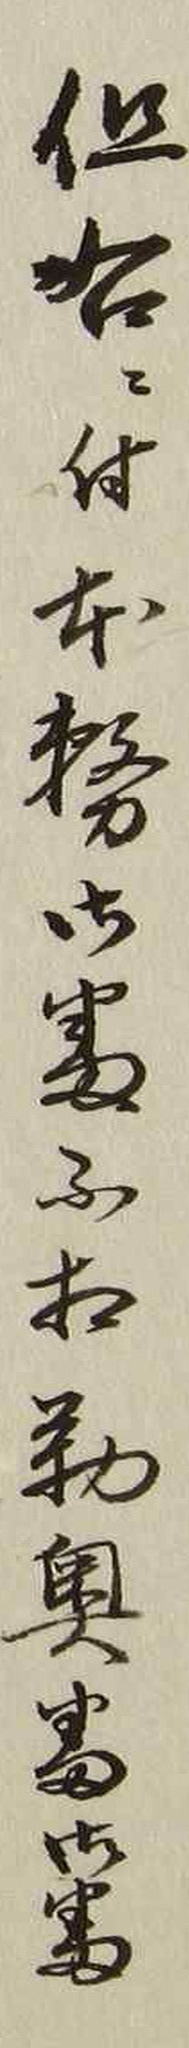但右ニ付本務御番不相勤奥番御番
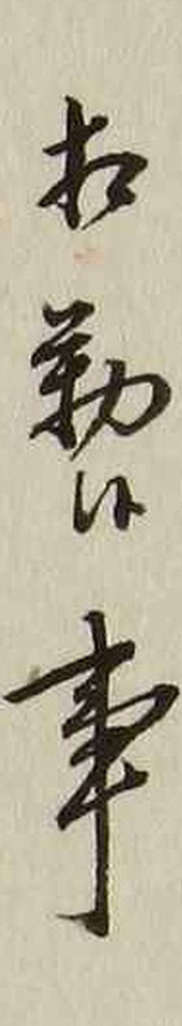相勤候事
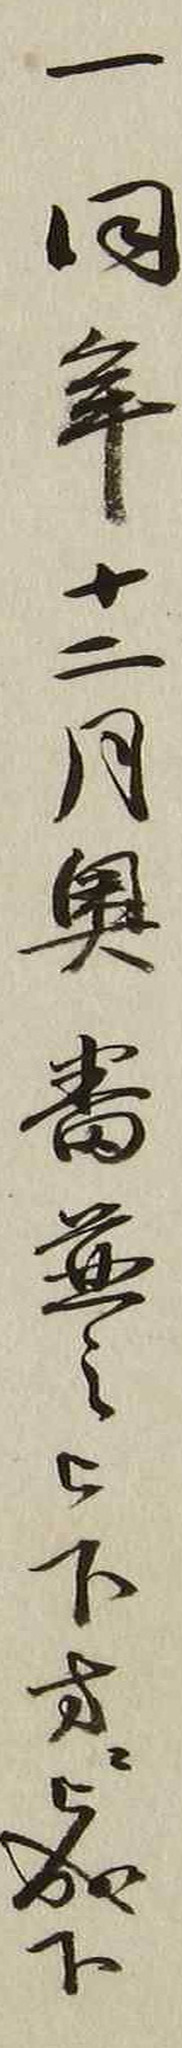一同年十二月奥番並之被下方ニ被成下
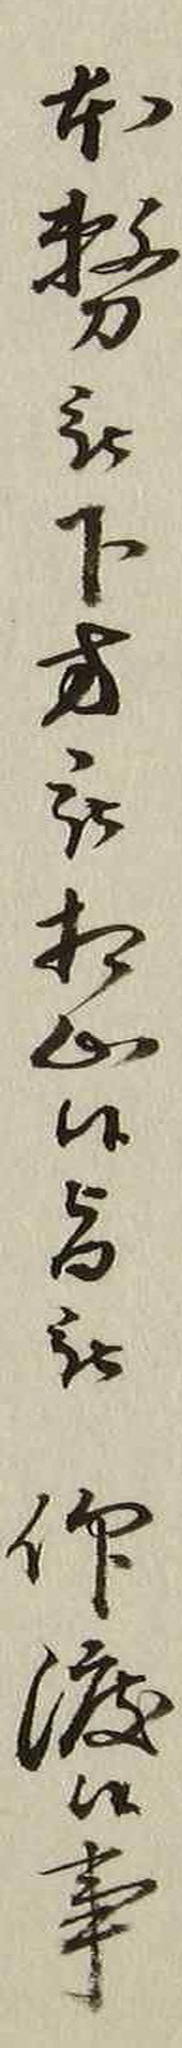本務被下方被相止候旨被仰渡候事
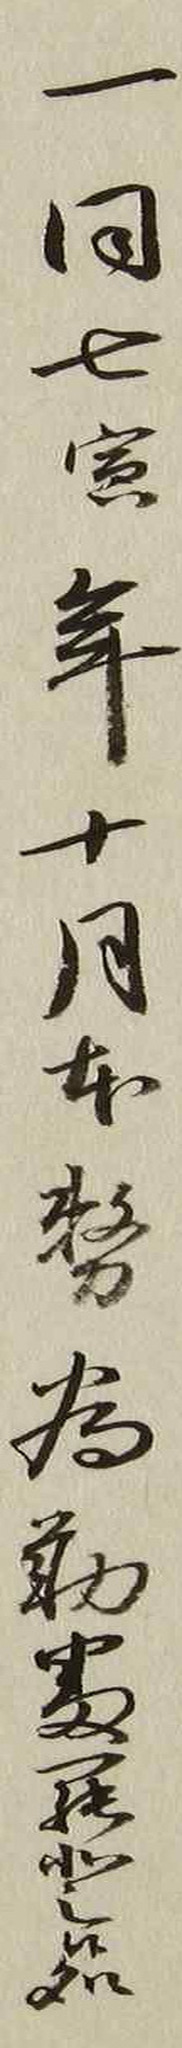一同七寅年十月本務為勤番罷登候処
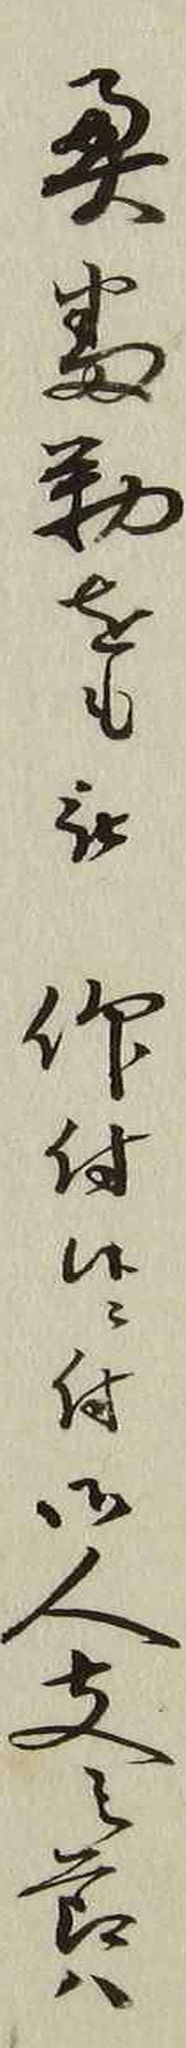奥番勤をも被仰付候ニ付御人支之節は
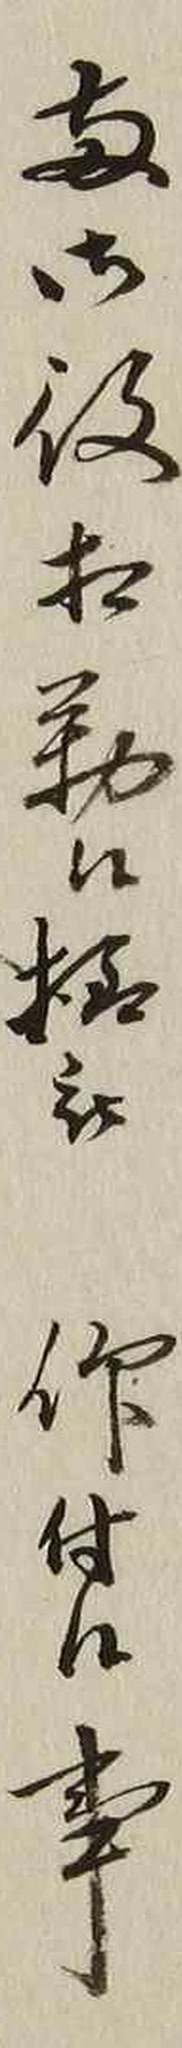両御役相勤候様被仰付候事
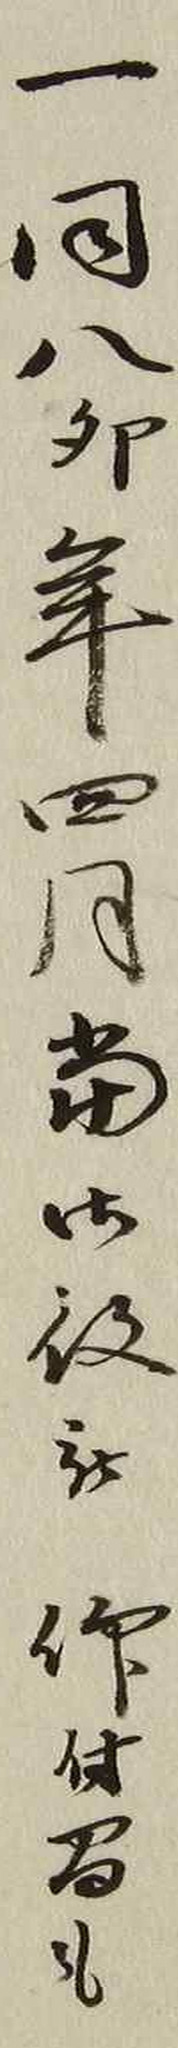一同八卯年四月当御役被仰付間も
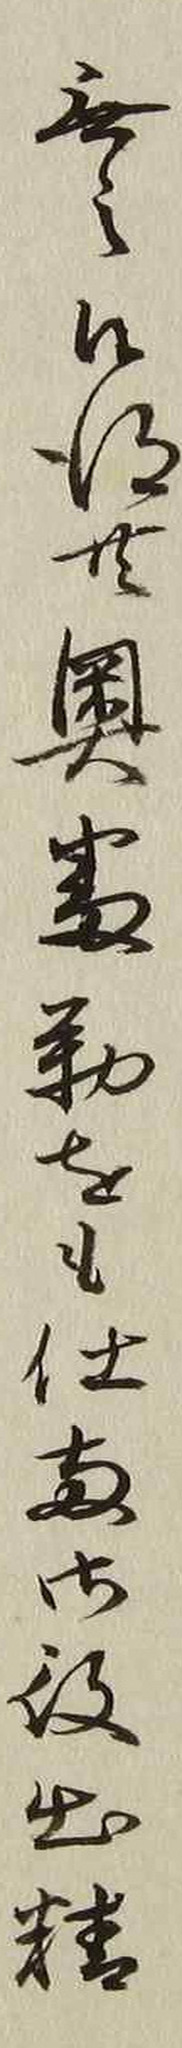無之候得共奥番勤をも仕両御役出精
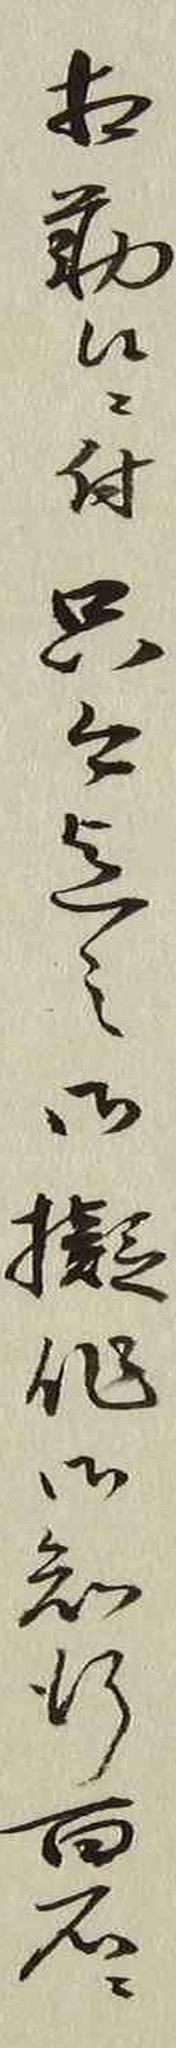相勤候ニ付只今迄之御擬作御知行百石ニ
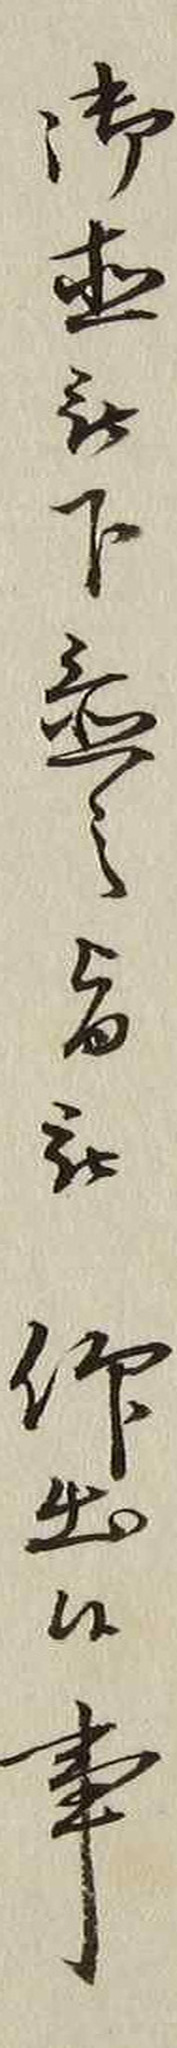御直被下置之旨被仰出候事
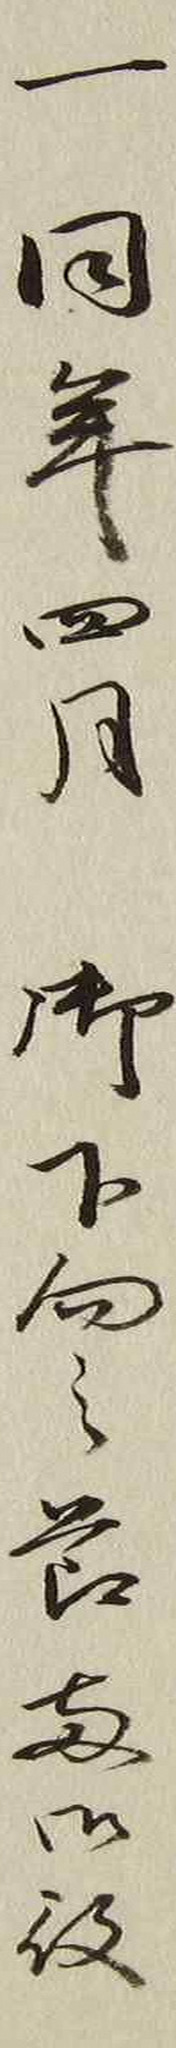一同年四月御下向之節両御役
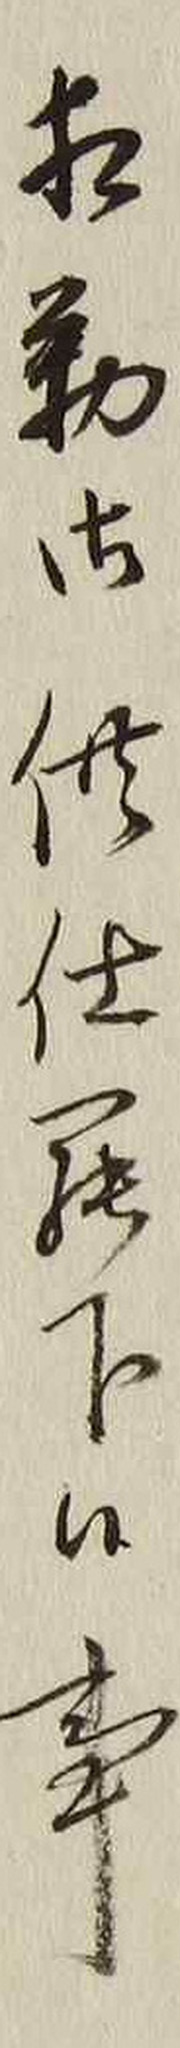相勤御供仕罷下候事
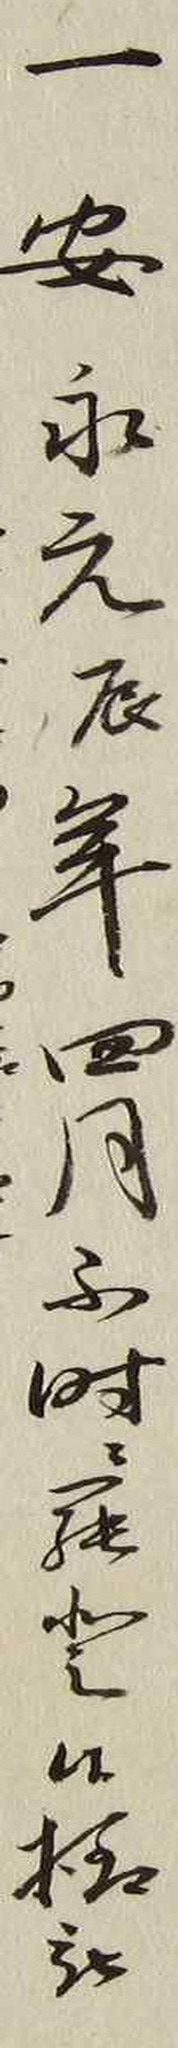一安永元辰年四月不時ニ罷登候様被
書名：諸士系譜　巻之160　な之部2
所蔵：会津若松市立会津図書館
